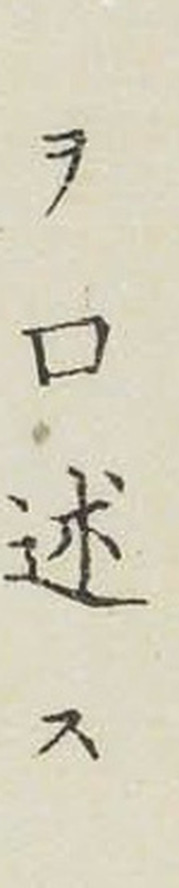ヲ口述ス
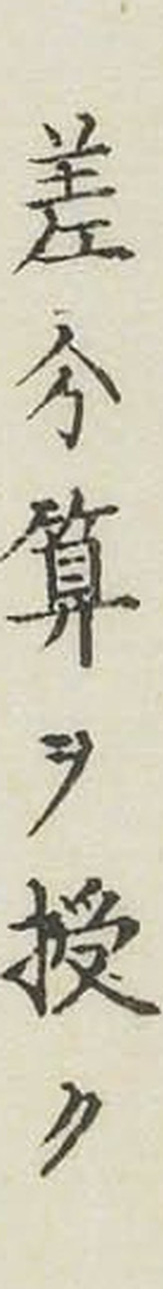差分算ヲ授ク
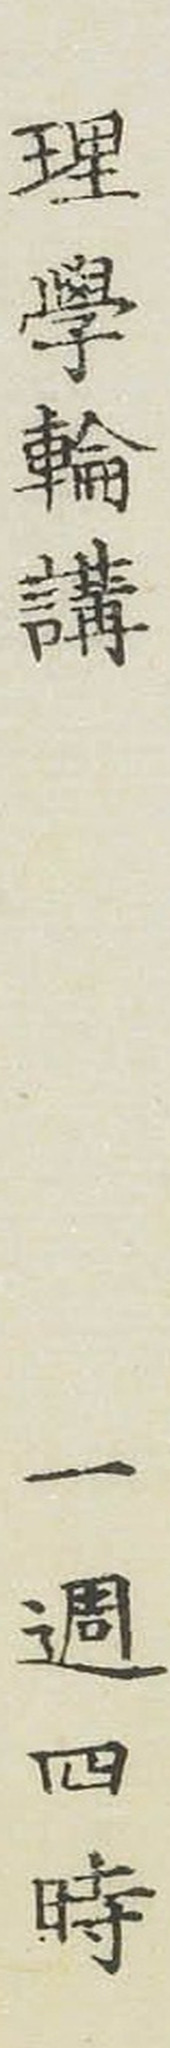理学輪講一週四時
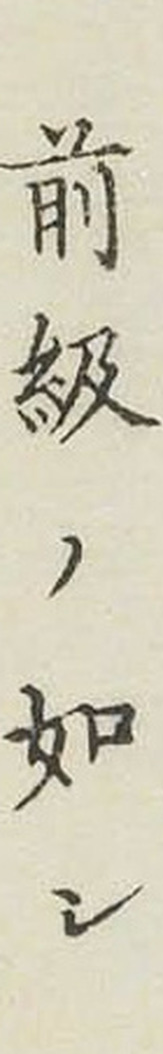前級ノ如シ
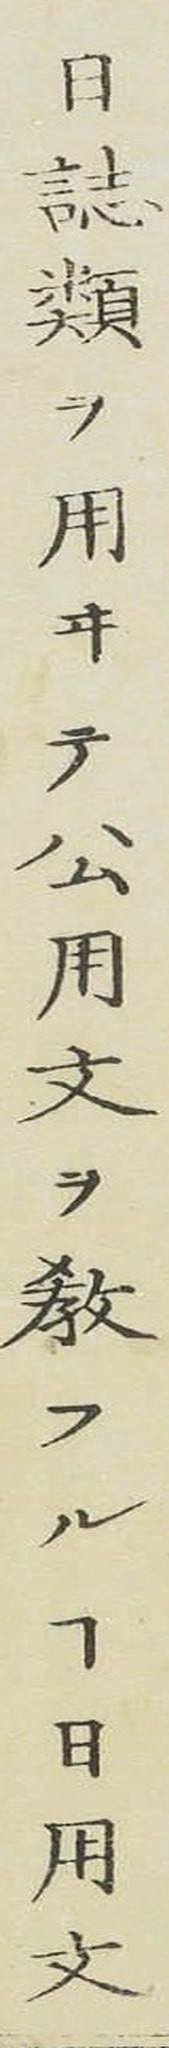日誌類ヲ用ヰテ公用文ヲ教フル事日用文
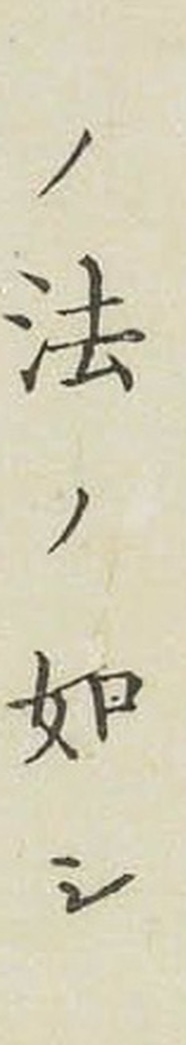ノ法ノ如シ
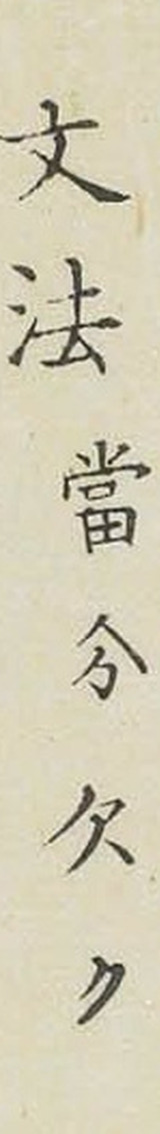文法当分欠ク
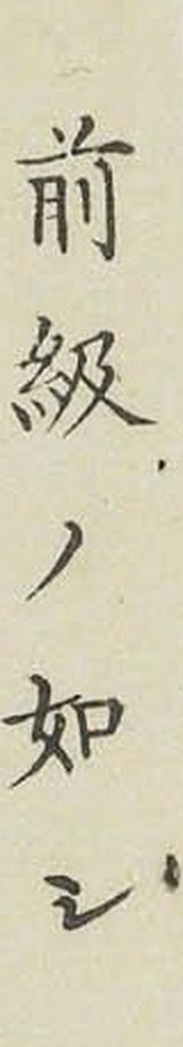前級ノ如シ
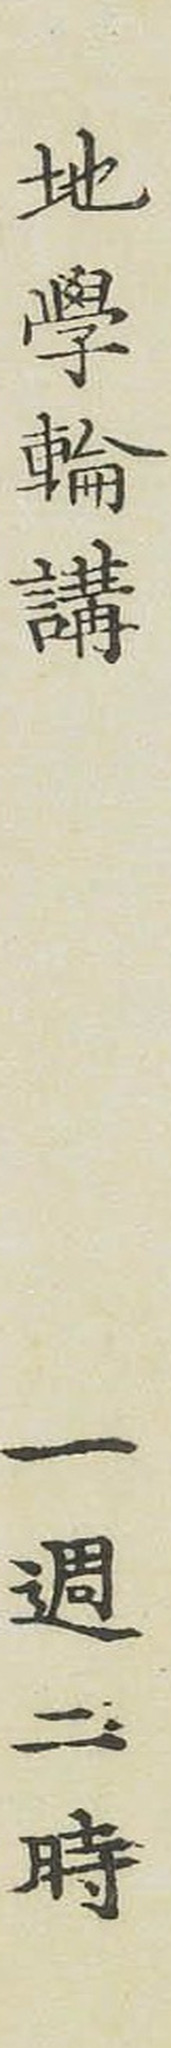地学輪講一週二時
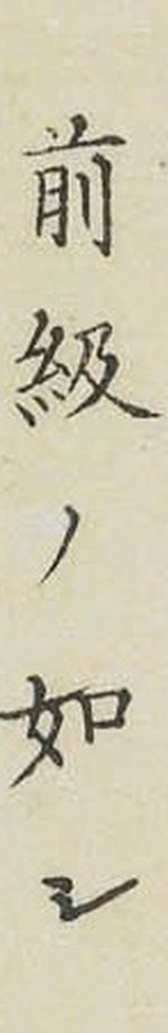前級ノ如シ
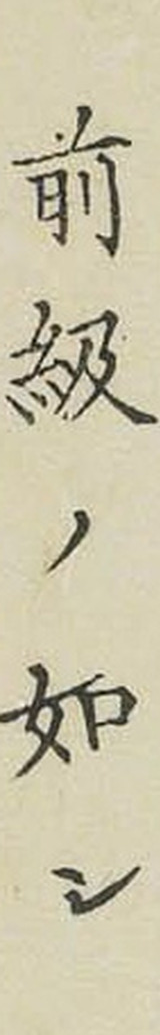前級ノ如シ

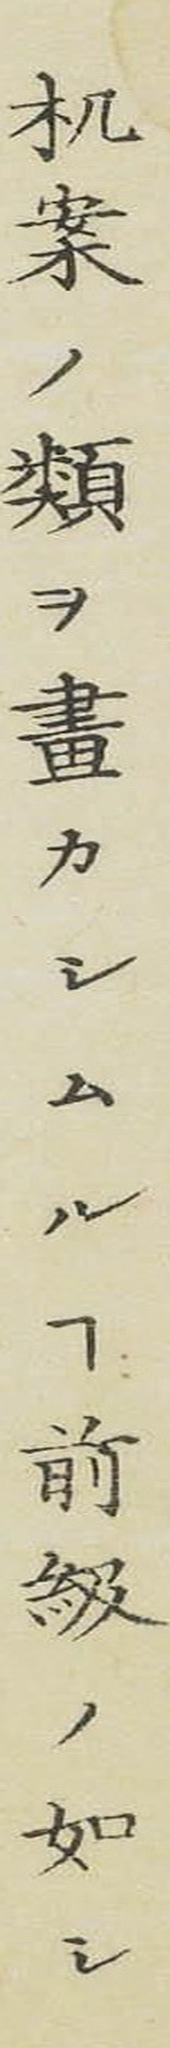机案ノ類ヲ書カシムル事前級ノ如シ
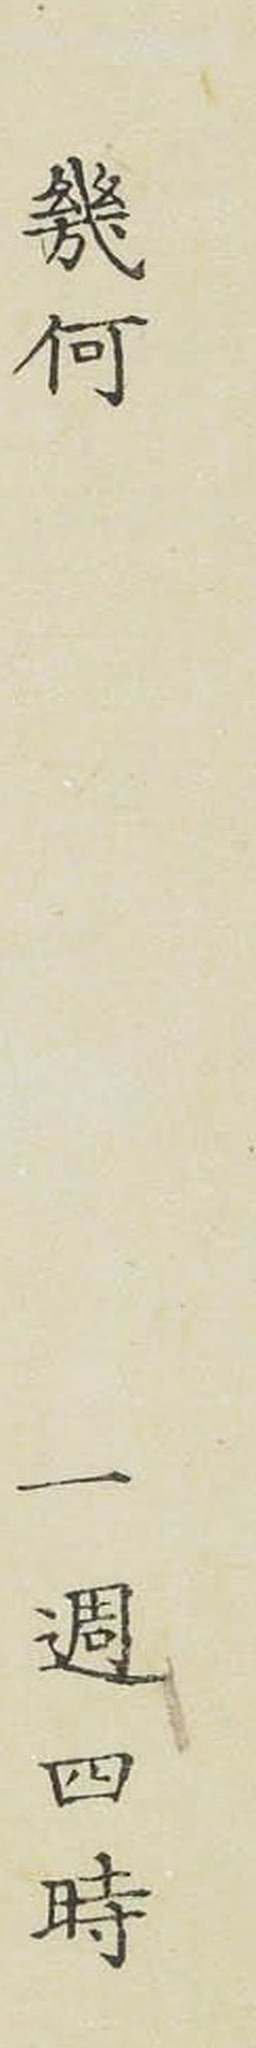幾何一週四時
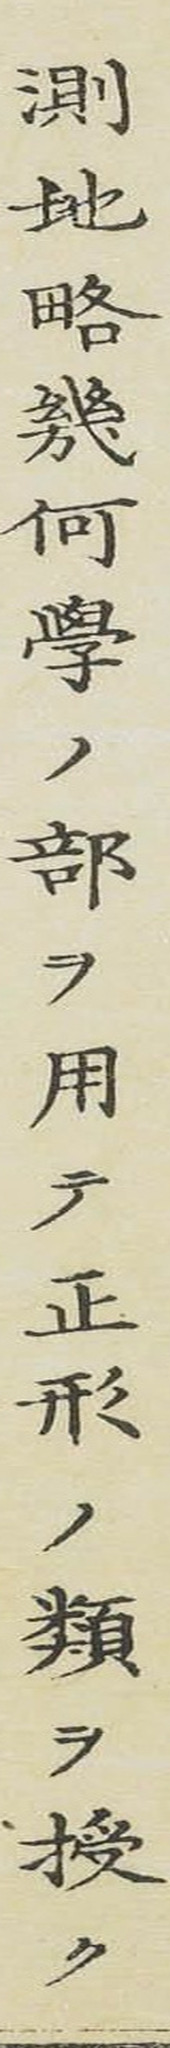測地略幾何学ノ部ヲ用テ正形ノ類ヲ授ク
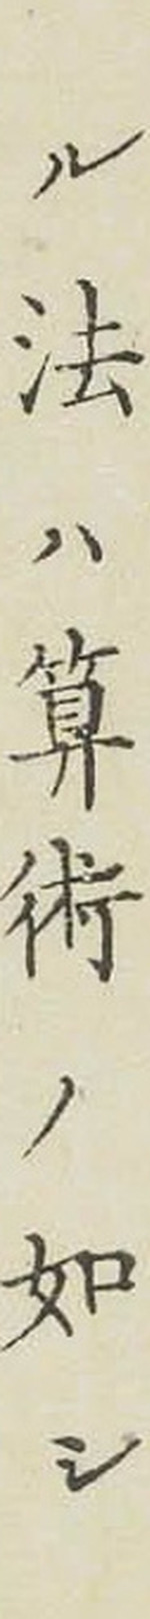ル法ハ算術ノ如シ
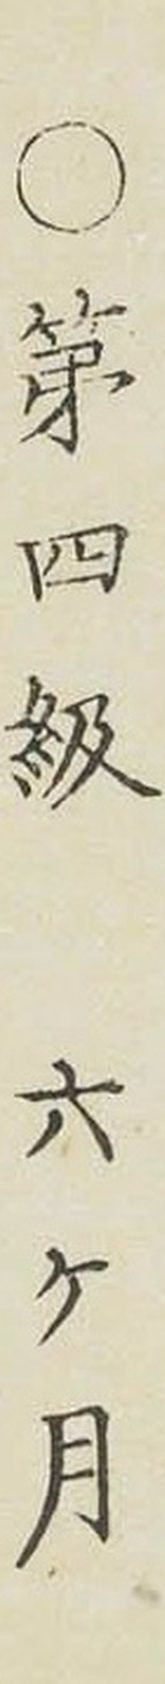○第四級六ケ月
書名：小学教則
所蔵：東京学芸大学教育コンテンツアーカイブ
